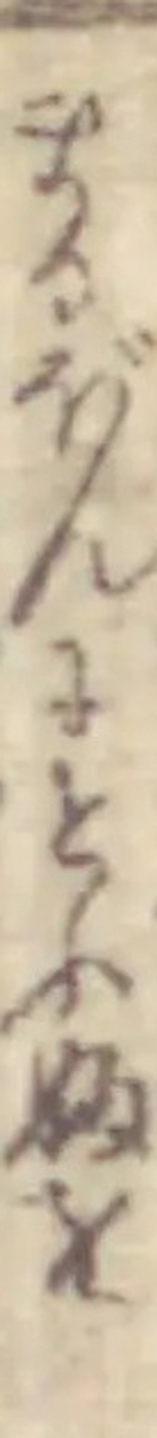まるぼんにとふふを
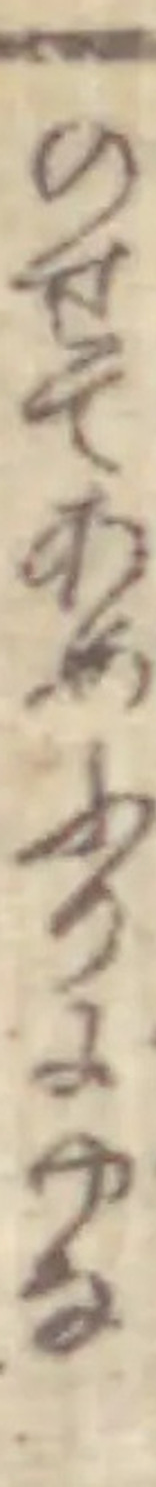のせてあめふりにやな
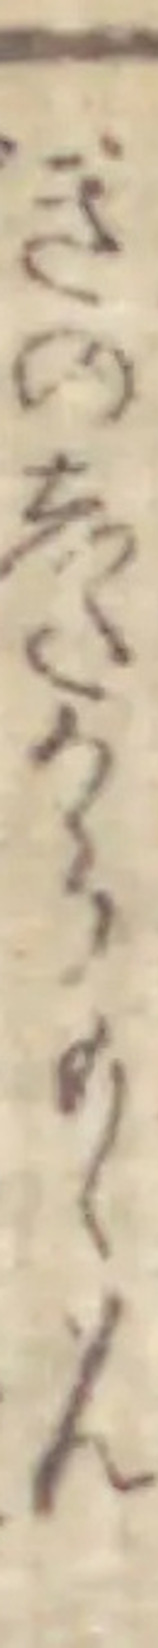ぎのしたからもゝん
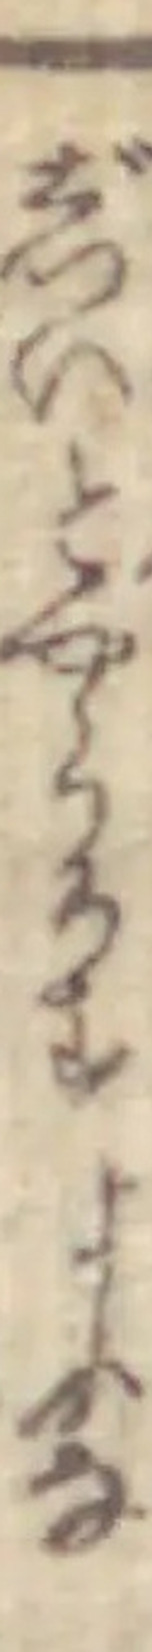じいとやらかすよふな
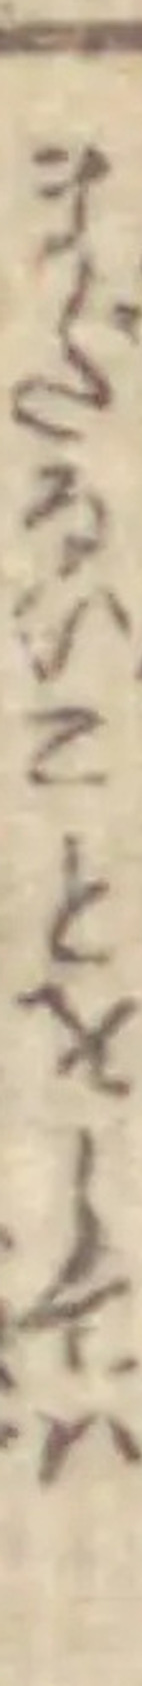まだるいことをしては
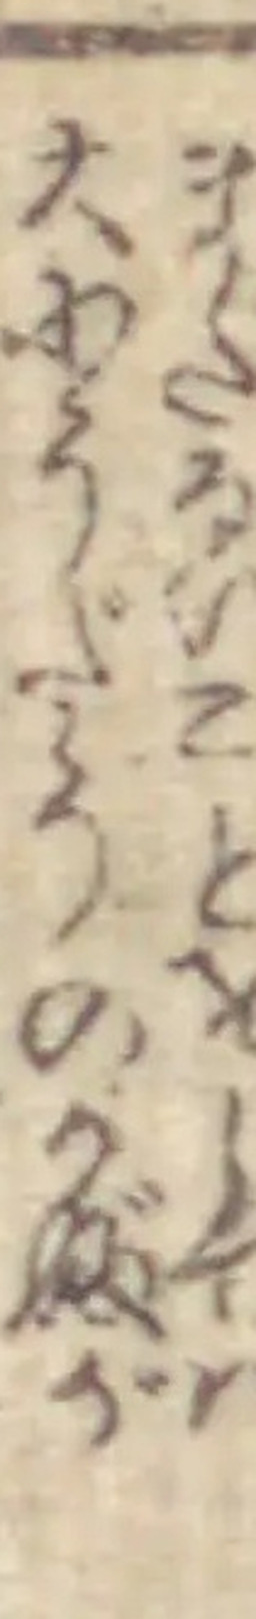大にうだうのかぶが
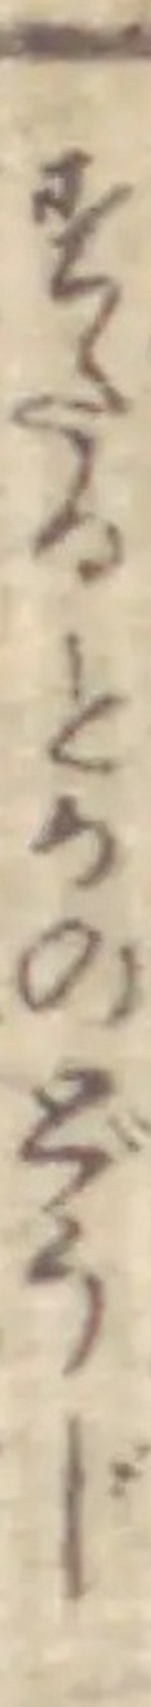すたるとかのどうじ
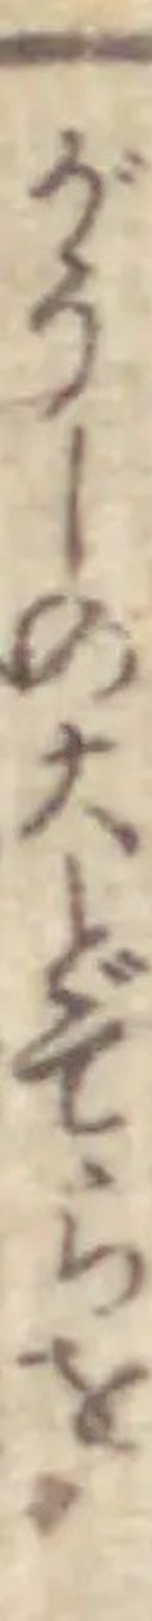がうしの大どてらを
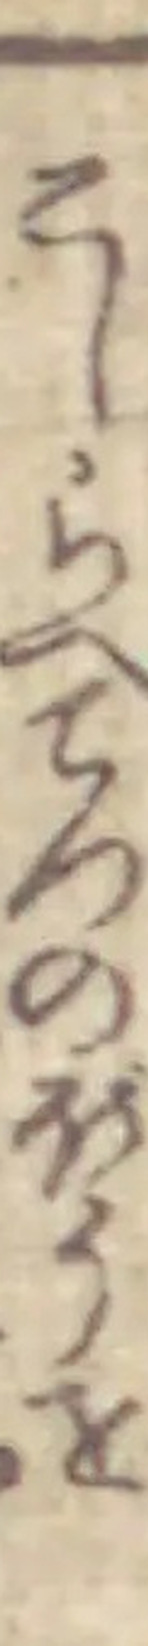こしらへてつのぼうを
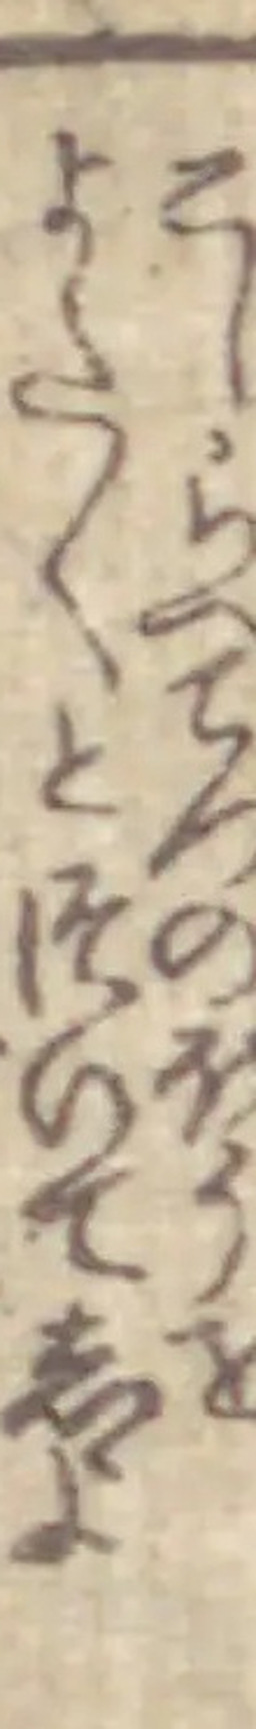よた〳〵とついてしよ
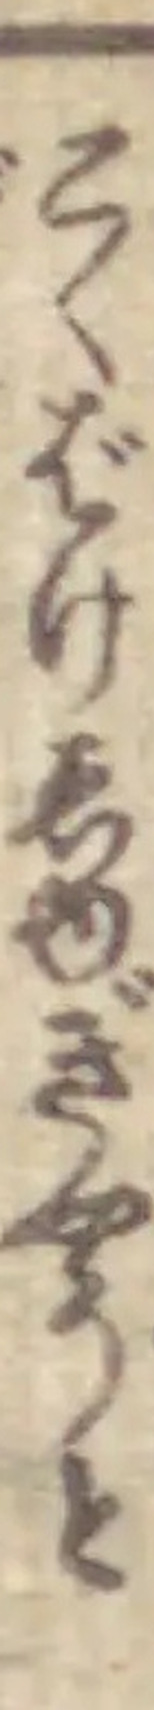こくばけしゆぎやうと
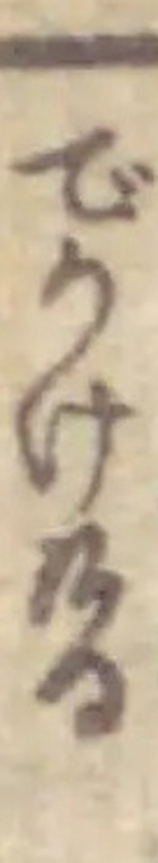でかけける

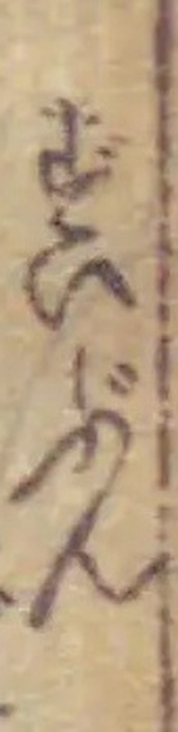ずいぶん
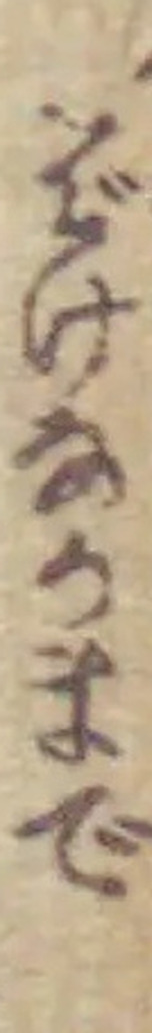ばけなかまで
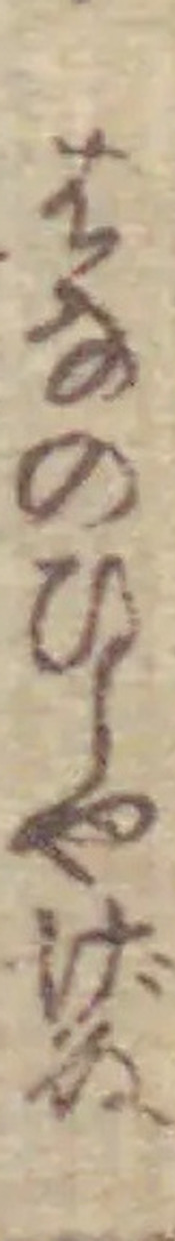はなのひしやげぬ
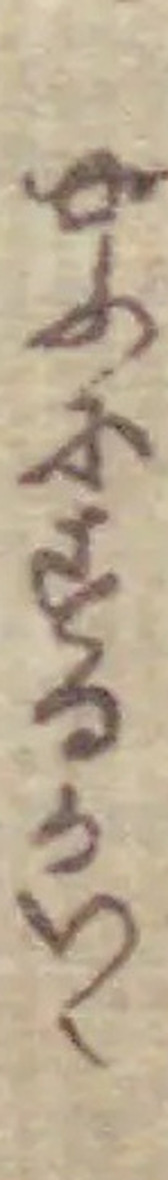やふにするかいゝ
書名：大昔化物双紙 2巻
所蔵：国立国会図書館 National Diet Library, JAPAN
